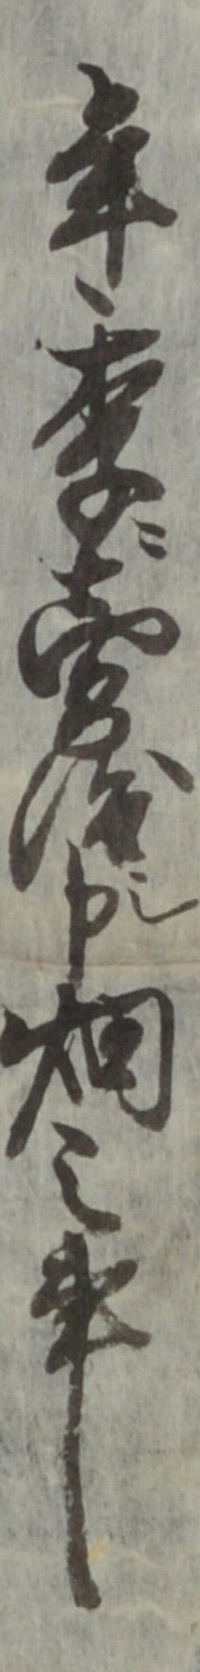年季ニ売渡し申畑之事
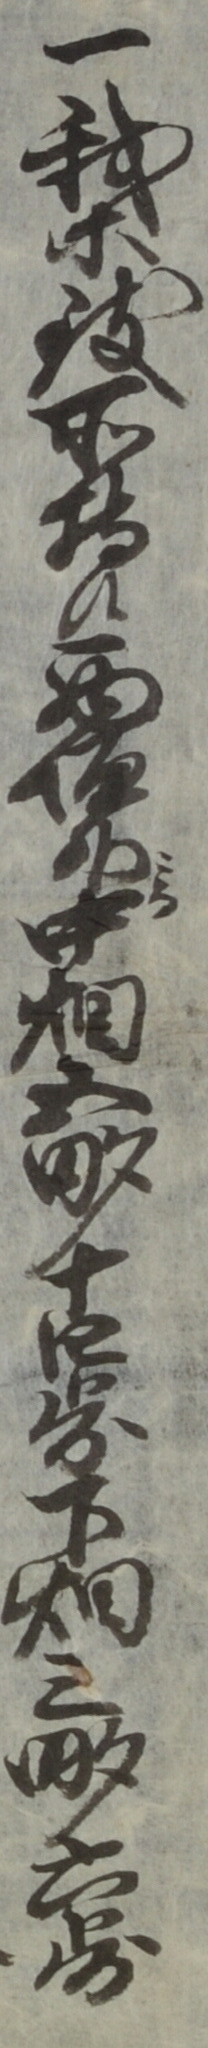一我等致所持候西垣外ニ而中畑五畝十四歩下畑三畝六歩
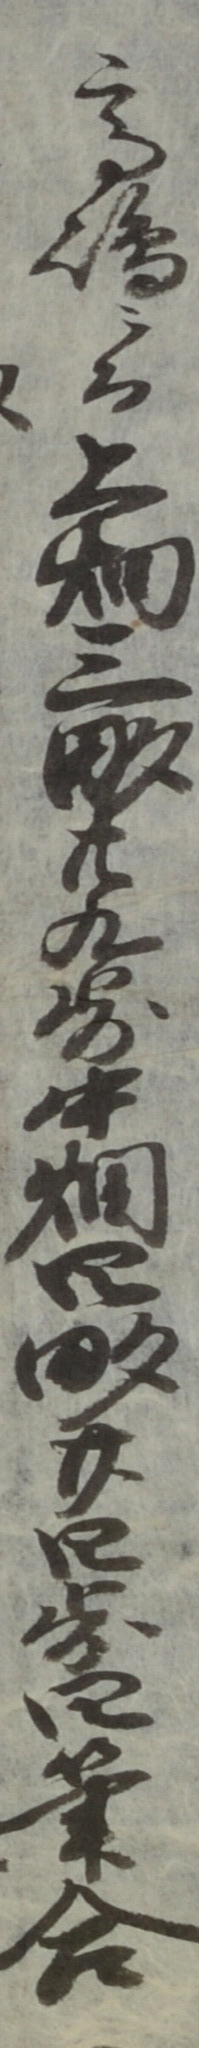高島ニ而上畑三畝廿九歩中畑四畝廿四歩四筆合
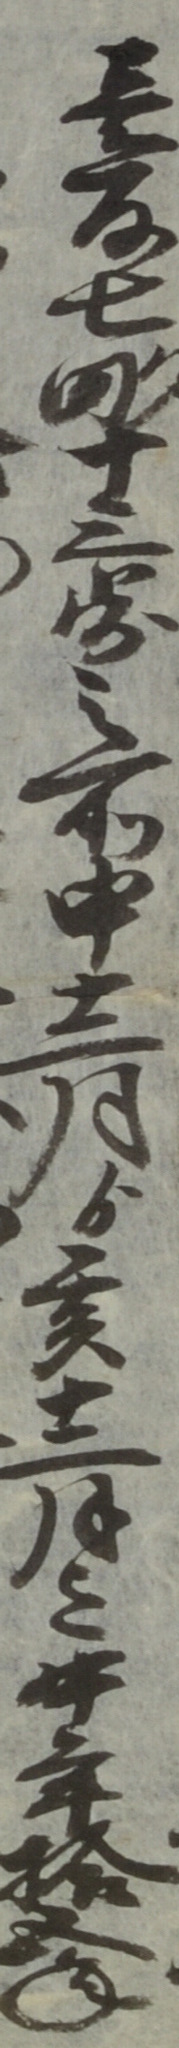壱反七畝十三歩之所申十二月より亥十二月迄中年拾五年
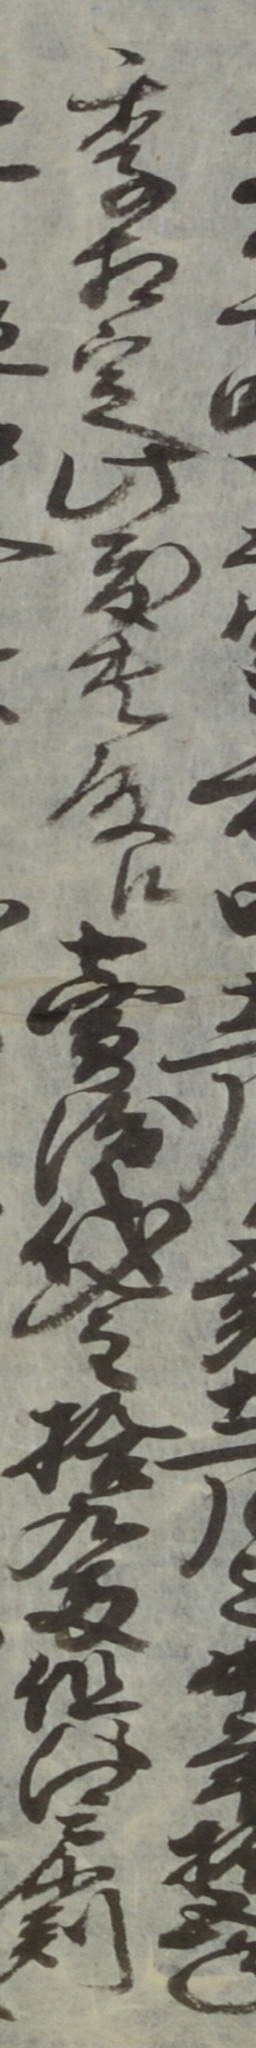季相定此度貴殿江売渡代金拾九両但し江戸小割
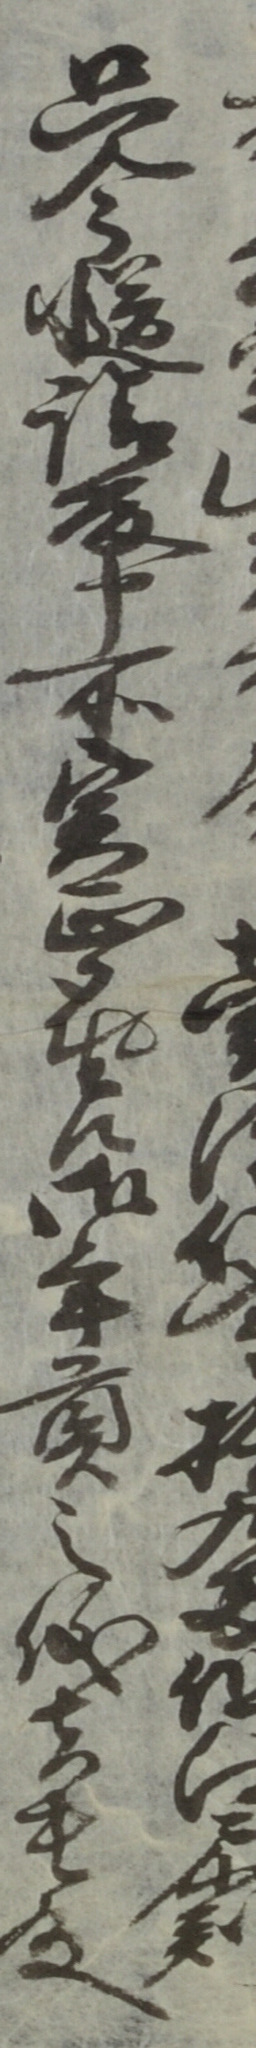只今慥請取申所実正御座候御年貢之儀者貴殿
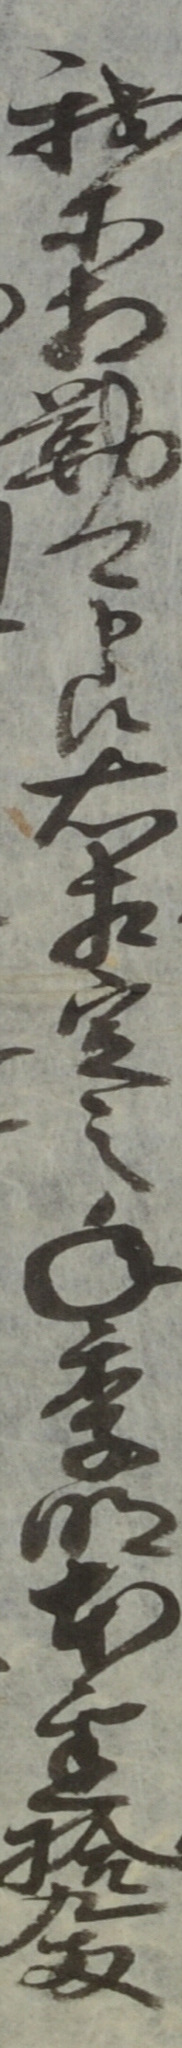我等相勧可申候右相定之年季明本金拾九両
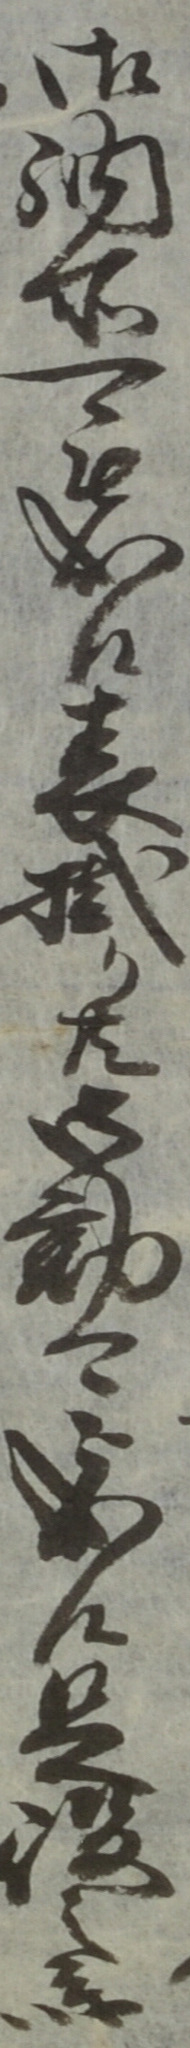御納取可被成候表掛り共御勤可被成候是役之義ハ
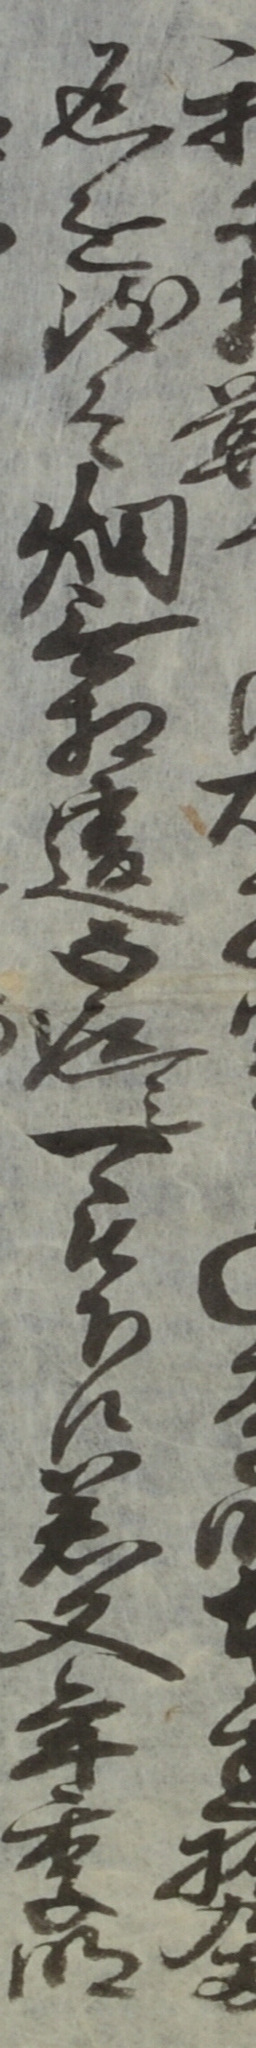返還致候ハヽ畑無相違御返し可被下候若又年季明
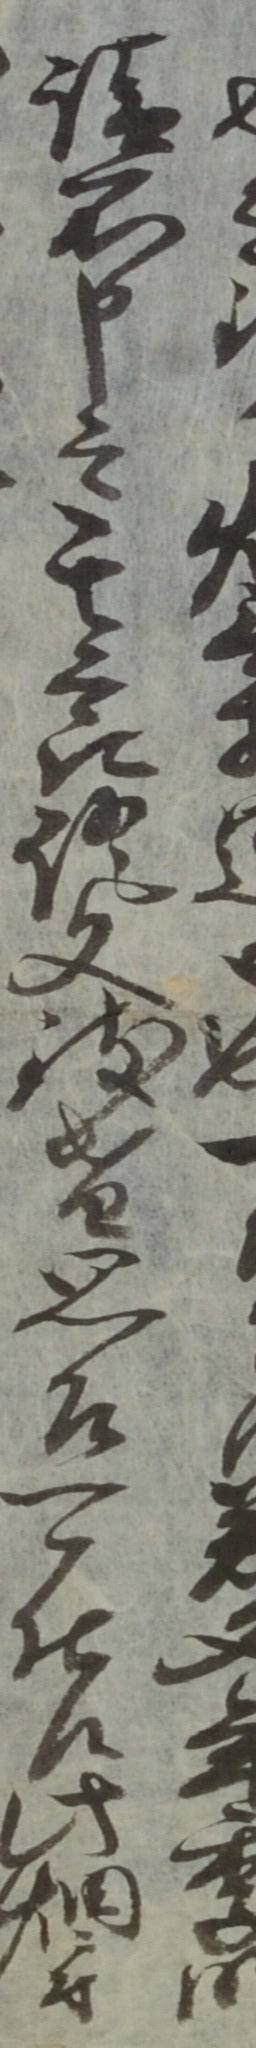請不申候ハヽ其節証文致替思召可仕候此畑ニ付
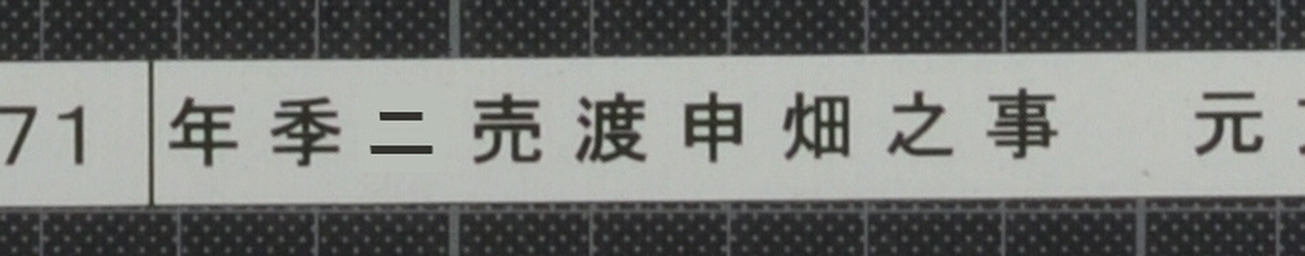年季ニ売渡し申畑之事
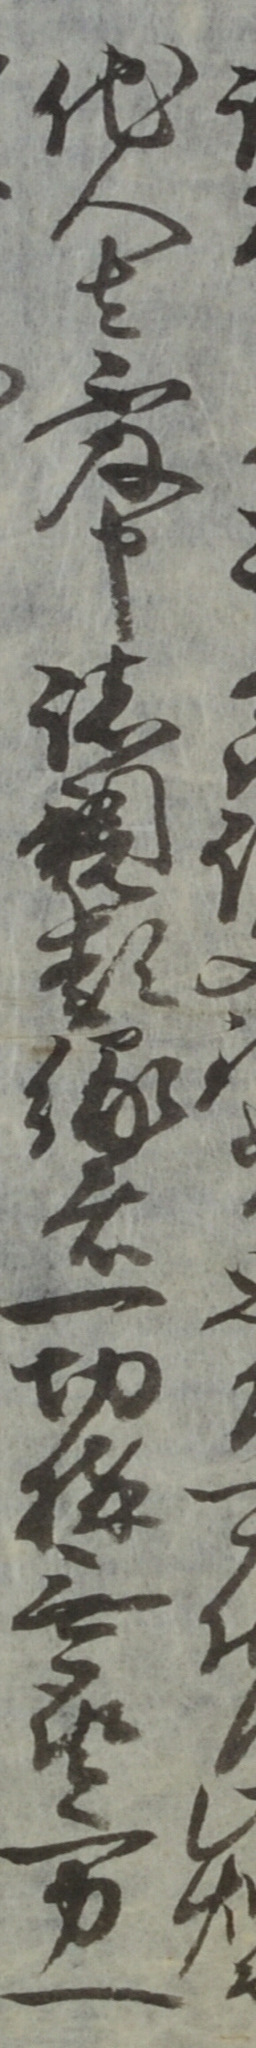他人者不及申諸親類縁者一切構無御座候万一
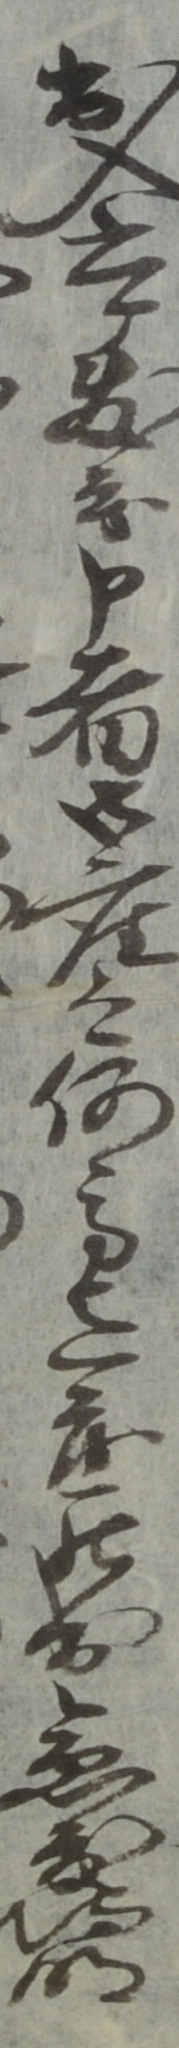出入六ケ敷義申者御座候ハヽ何方迄茂罷出急度場明
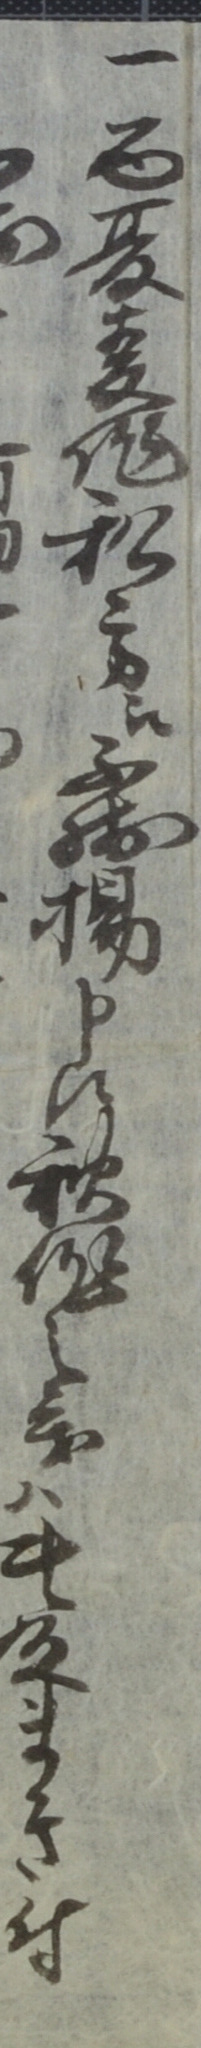一酉夏麦作私方江不残揚申候秋作之義ハ貴殿まき付
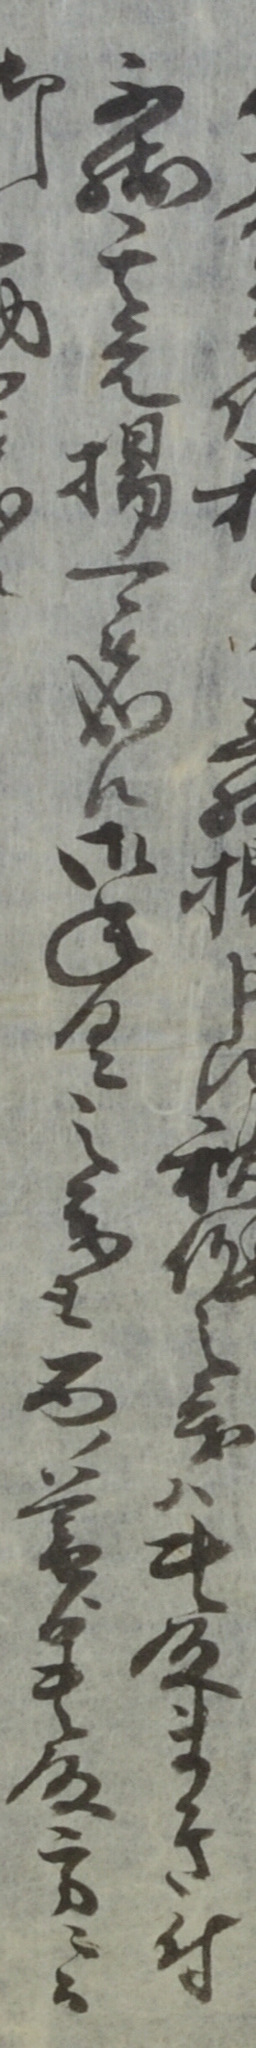不残其先揚可被成候御年具之義も酉ノ暮より貴殿方ニ而
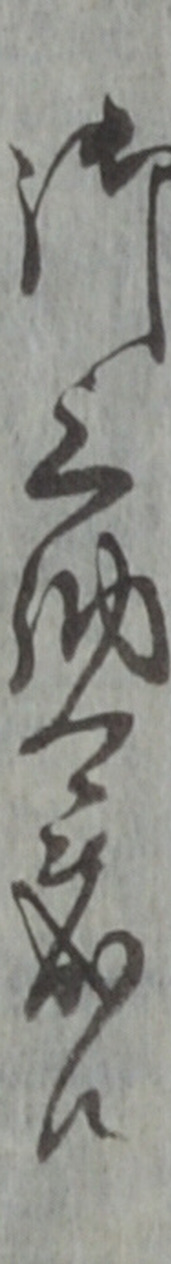御上納可被成候
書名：年季に売渡申畑之事
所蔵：伊那市立高遠町図書館・合同会社AMANE
